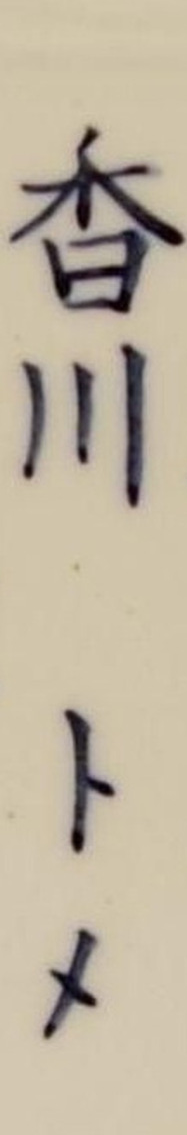香川トメ
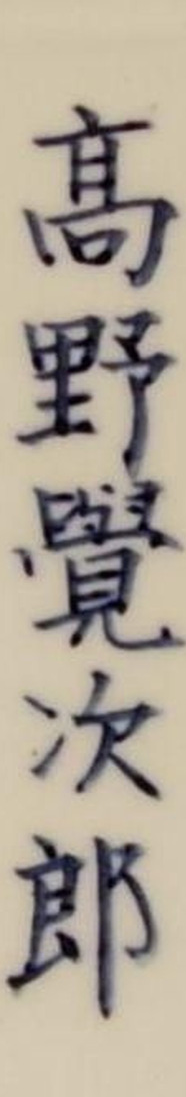高野覚次郎
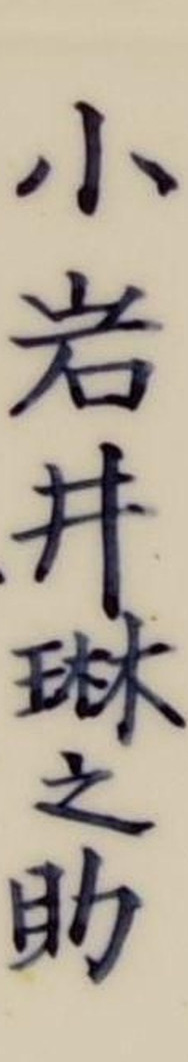小岩井琳之助
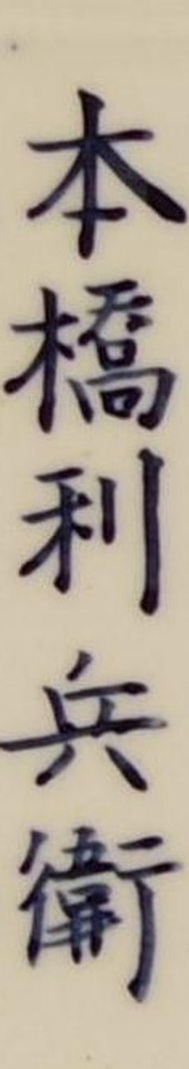本橋利兵衛
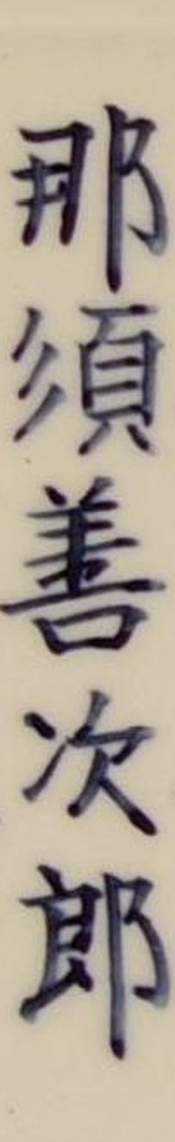那須善次郎
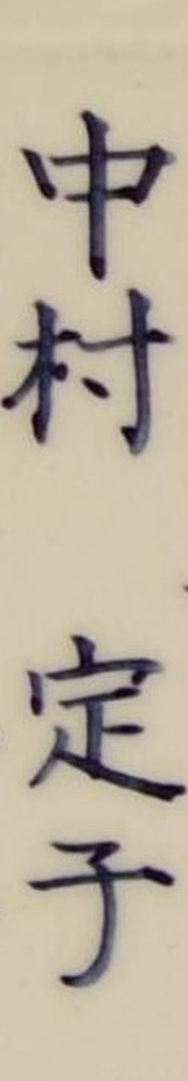中村定子
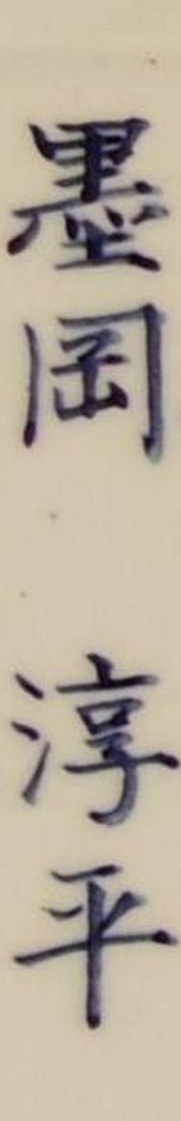墨岡淳平
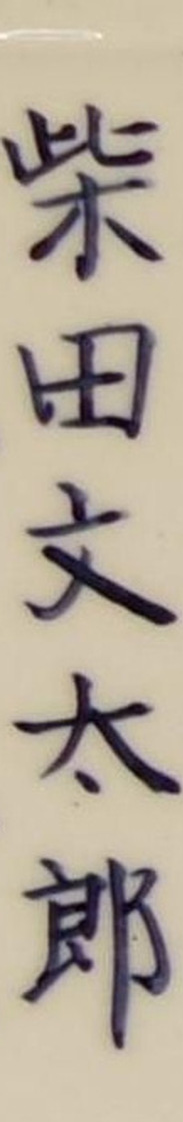柴田文太郎
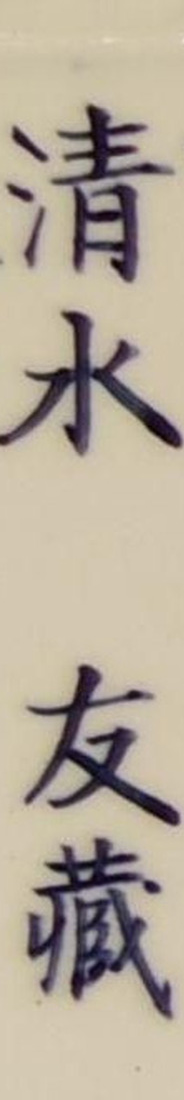清水友藏

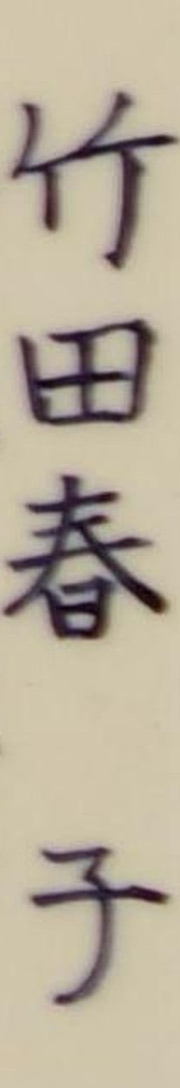竹田春子
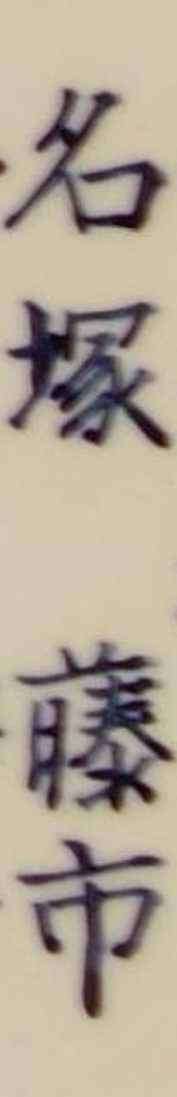名塚藤市
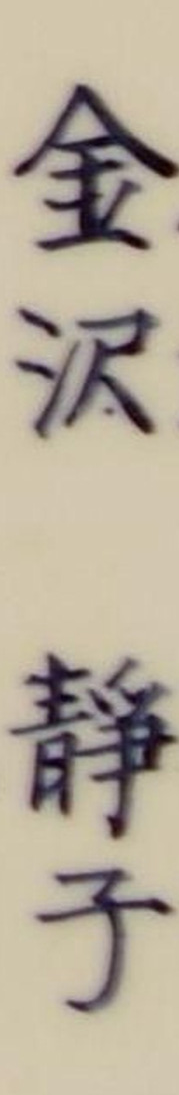金沢静子
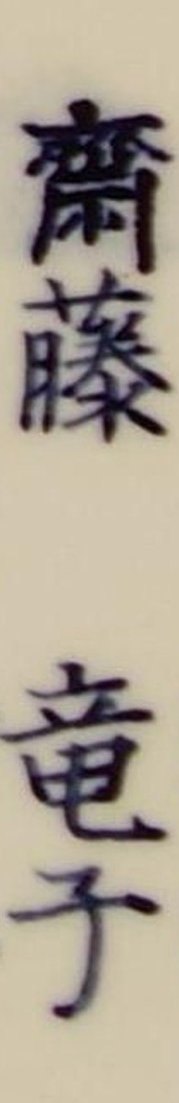斎藤竜子
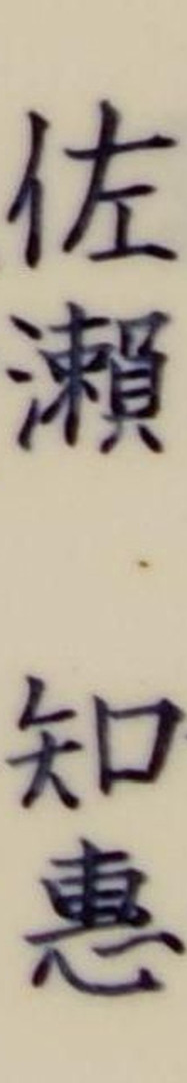佐瀬知恵
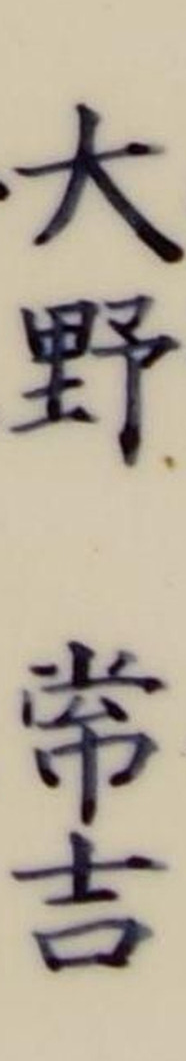大野常吉
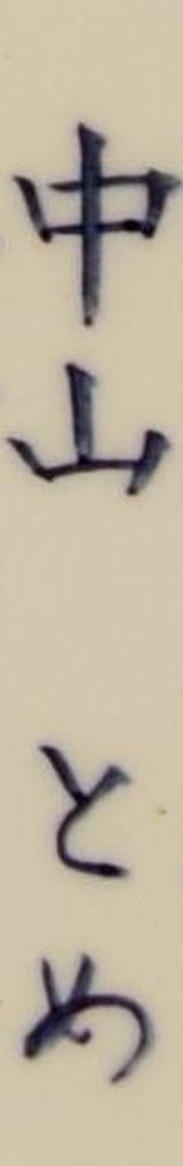中山とめ
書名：E~L
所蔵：高野山金剛峯寺
